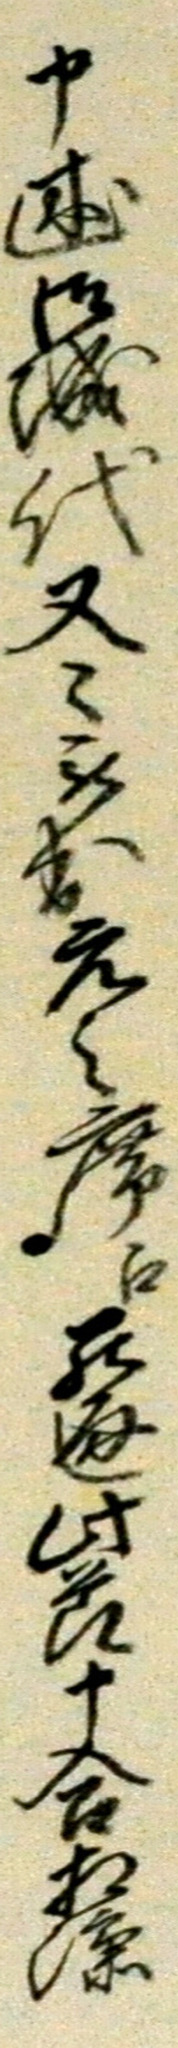申述御城代又々被出元之席え罷通此節申合相済
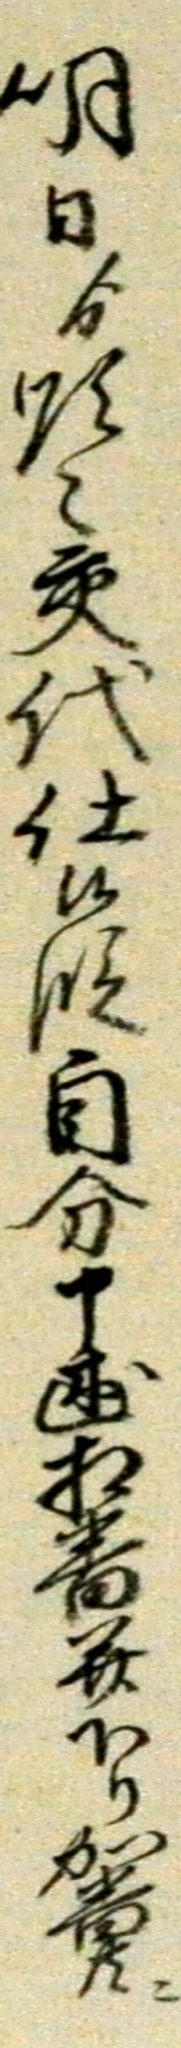明日ゟ順々交代仕候段自分申述相番并下り加番共ニ
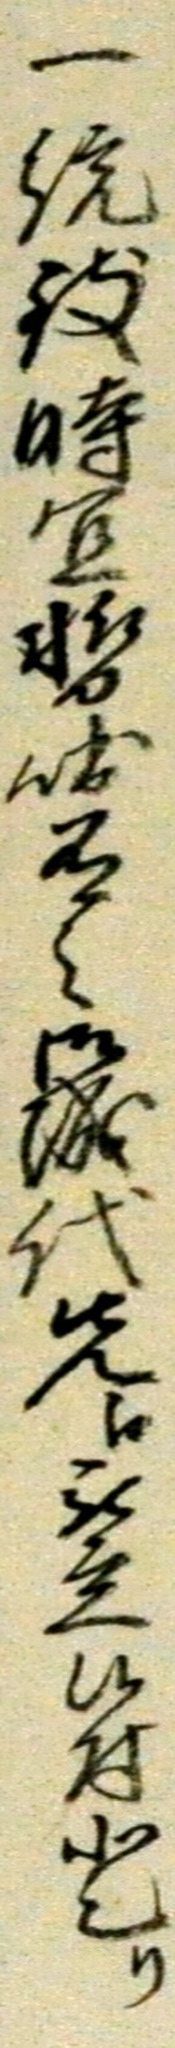一統致時宜暫咄有之御城代先え罷立候付登り
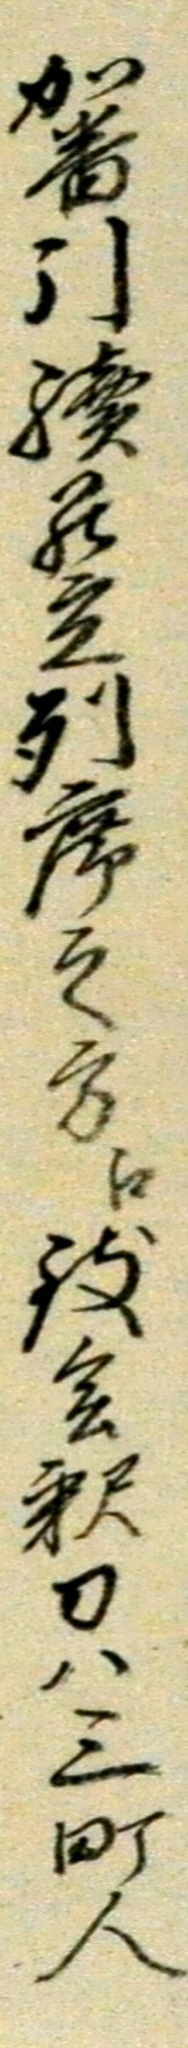加番引続罷立列席之方え致会釈刀ハ三町人
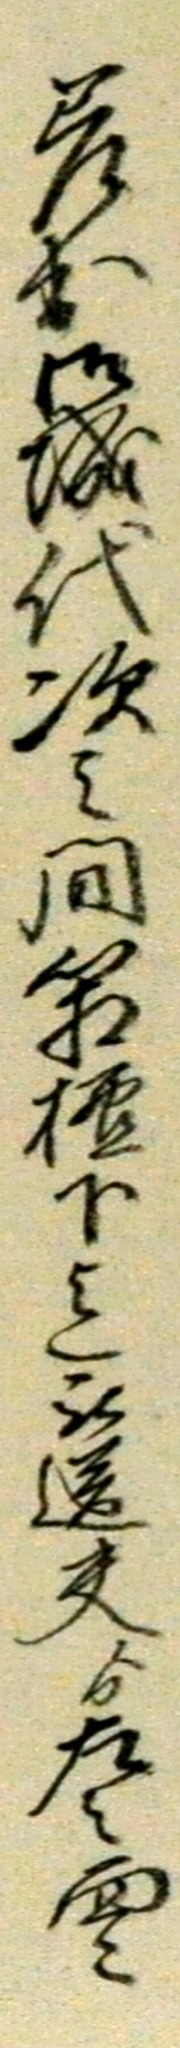差出御城代次之間箱檀下迄被送夫ゟ左之面々
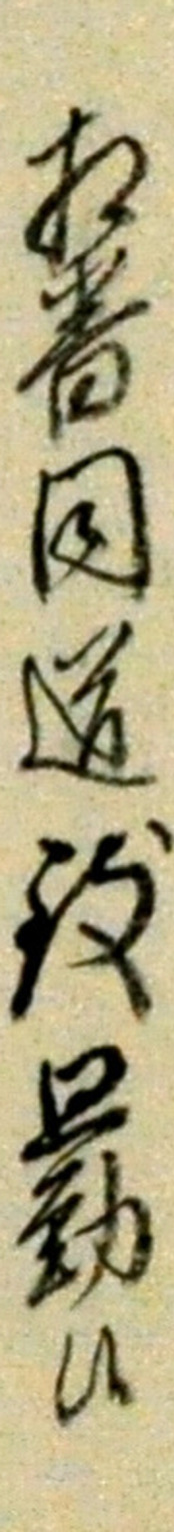相番同道致廻勤候
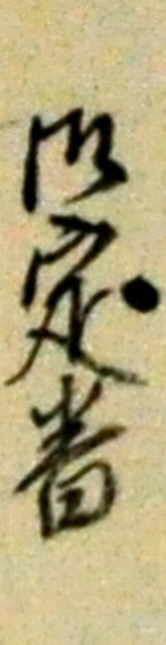御定番
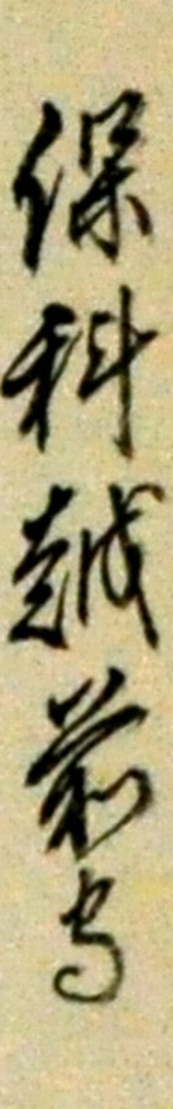保科越前守
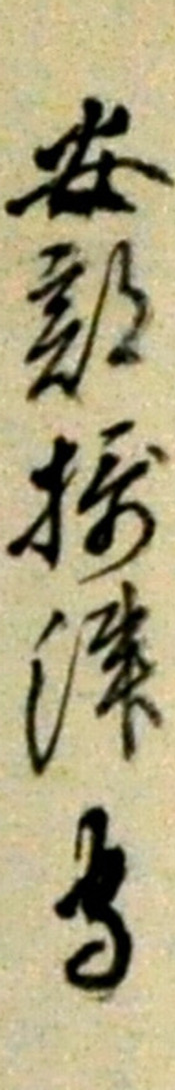安部攝津守

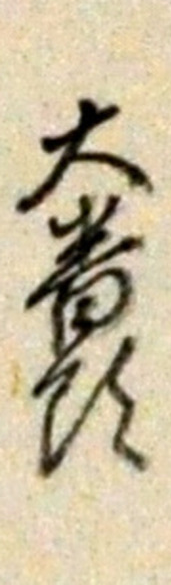大番頭
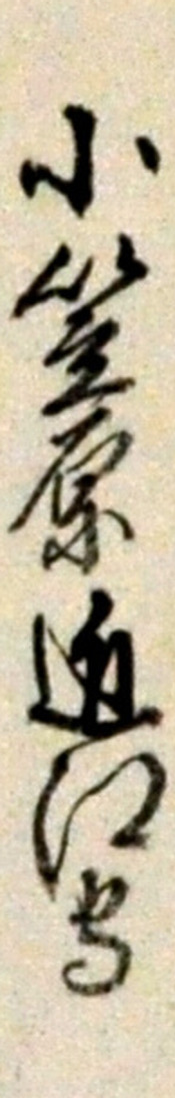小笠原近江守
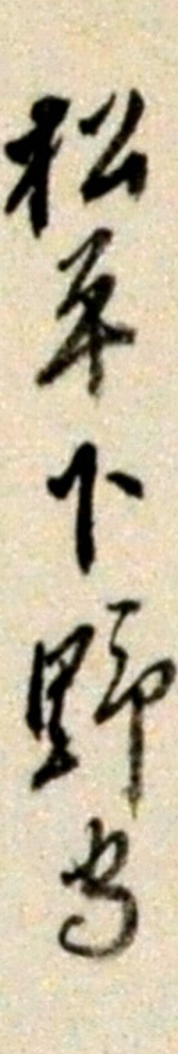松平下野守
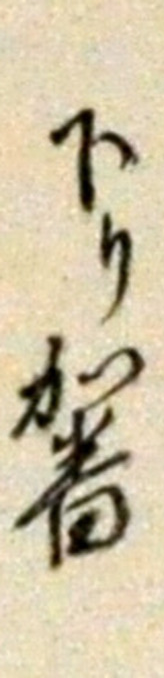下り加番
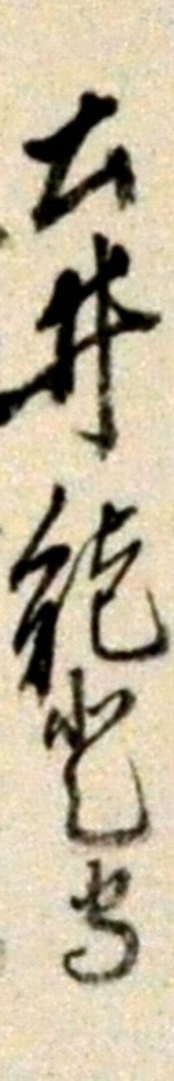土井能登守
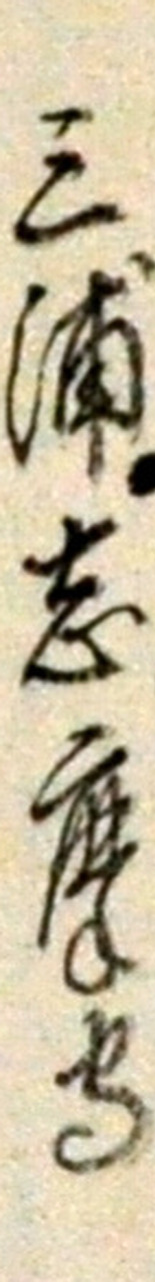三浦志摩守
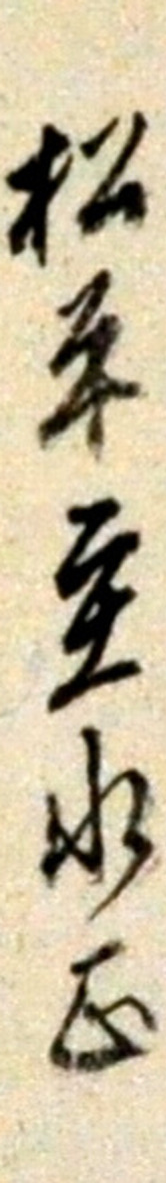松平主水正
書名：大阪加番関係諸書留〔一括〕
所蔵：伊那市立高遠町図書館・合同会社AMANE
